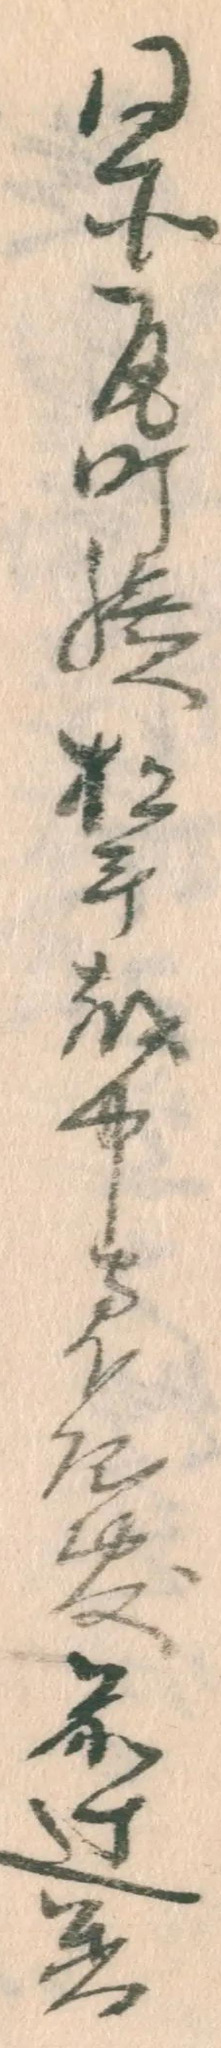同所瓦町続松平越中守下屋敷前辻番
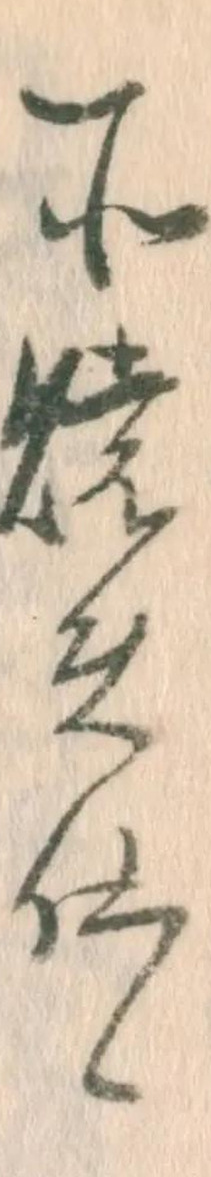所焼失仕候
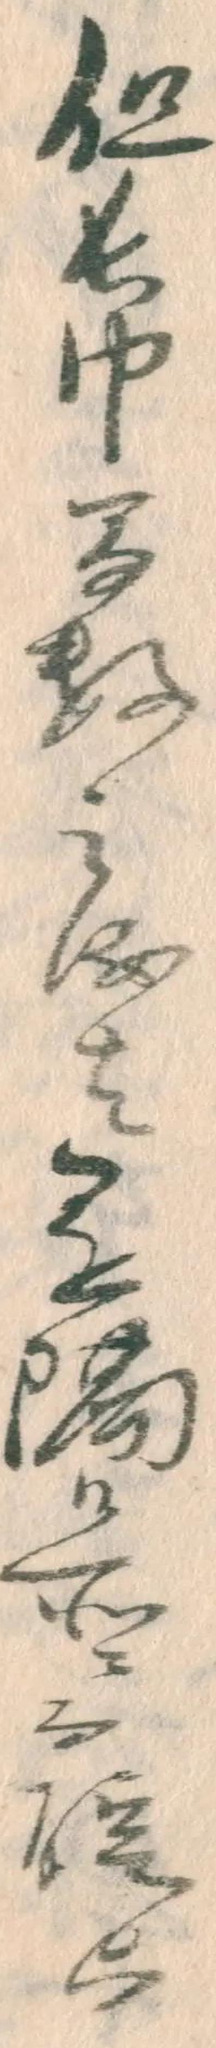但長幅間数之儀は懸隔候所ニ而聢と
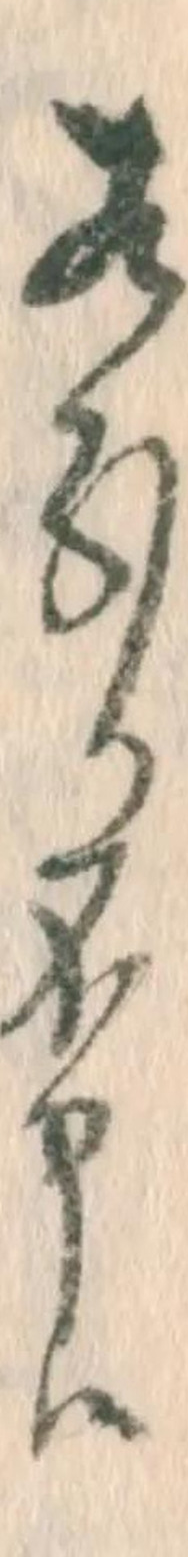相分リ不申候
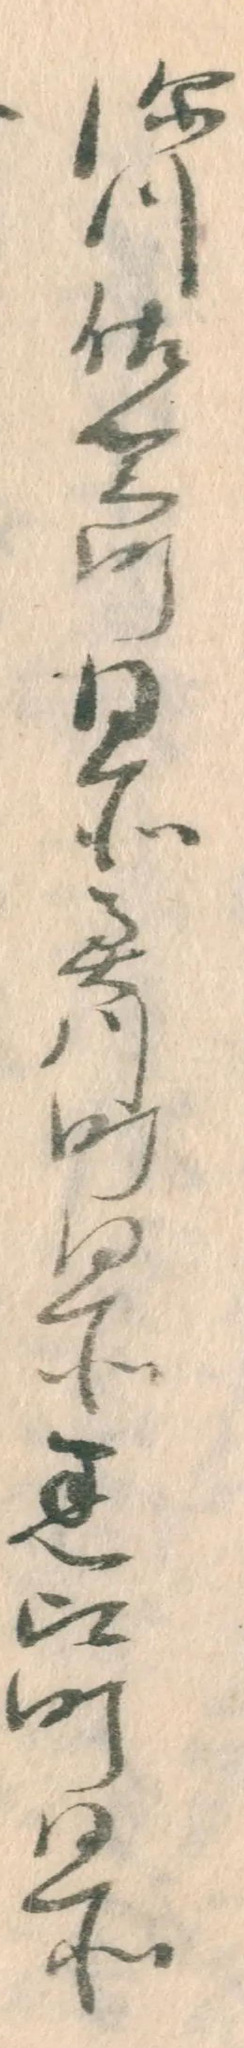一深川佐賀町同所奥川町同所黒江町同所
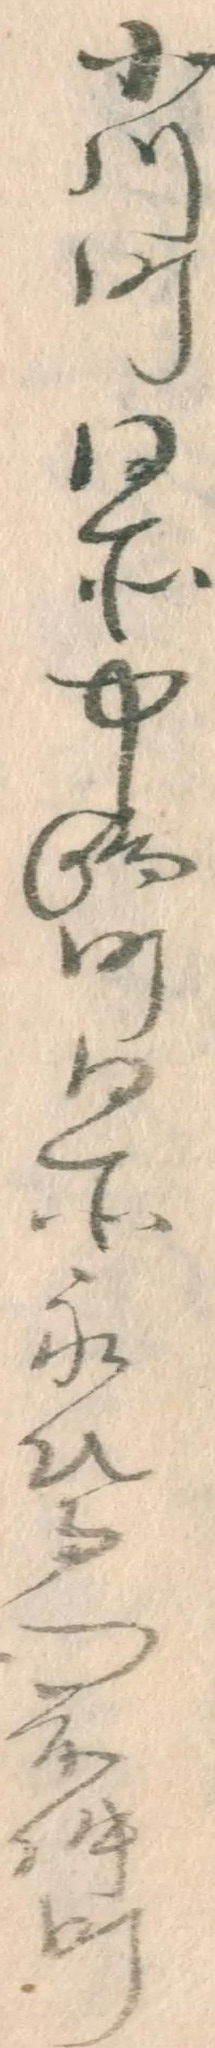小川町同所中嶋町同所永代寺門前仲町

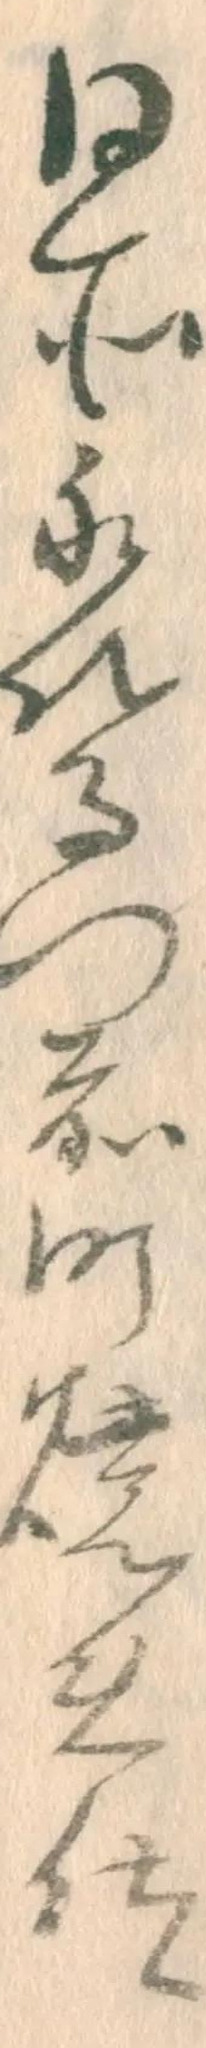同所永代寺門前町焼失仕候
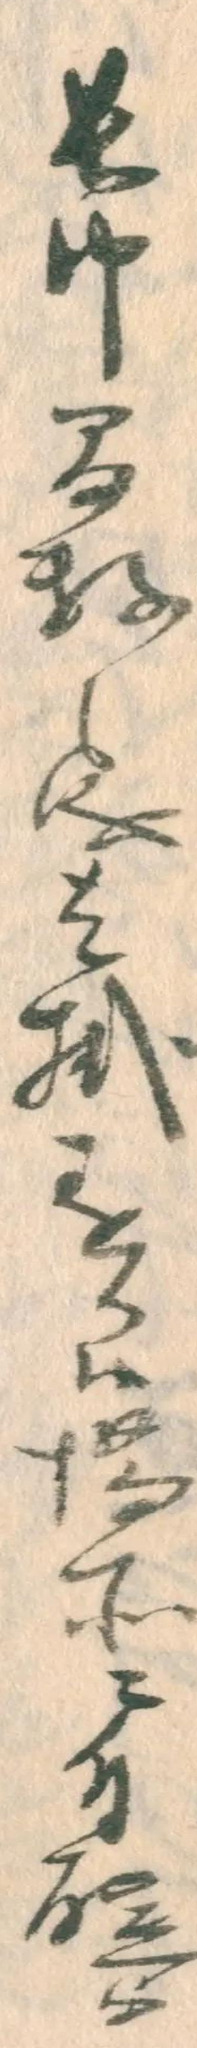長幅間数之儀は掛懸リ候場所ニ付聢と
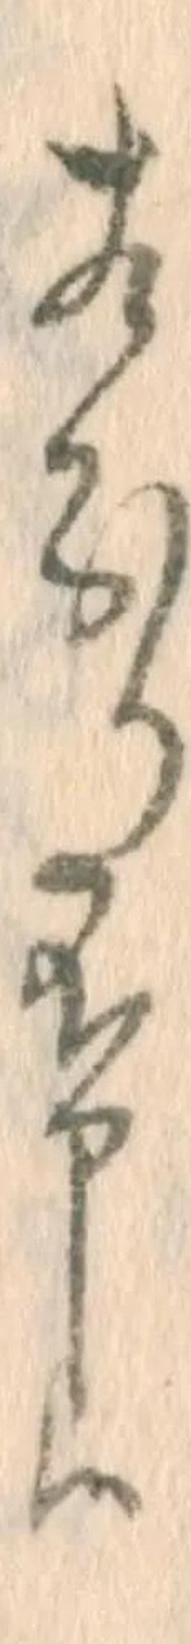相分リ不申候
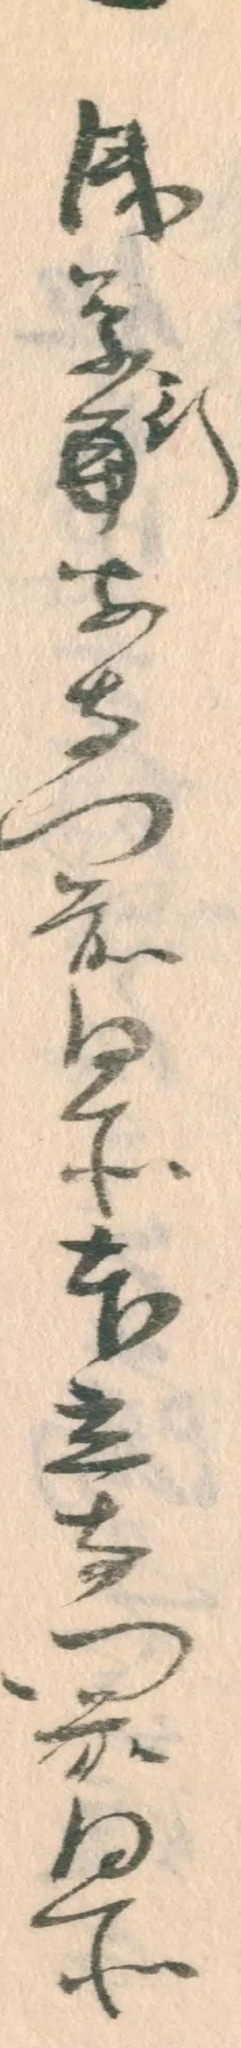一浅草行安寺門前同所本立寺門前同所
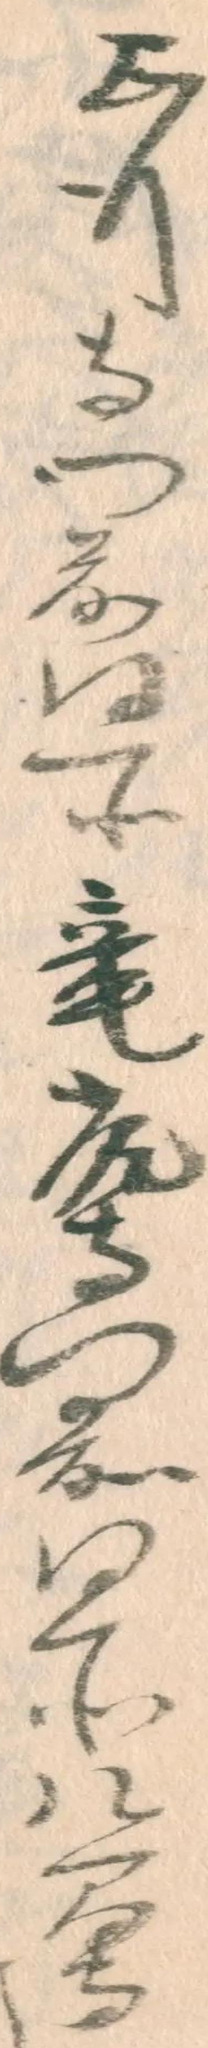正行寺門前同所竜寺門前同所八間寺町
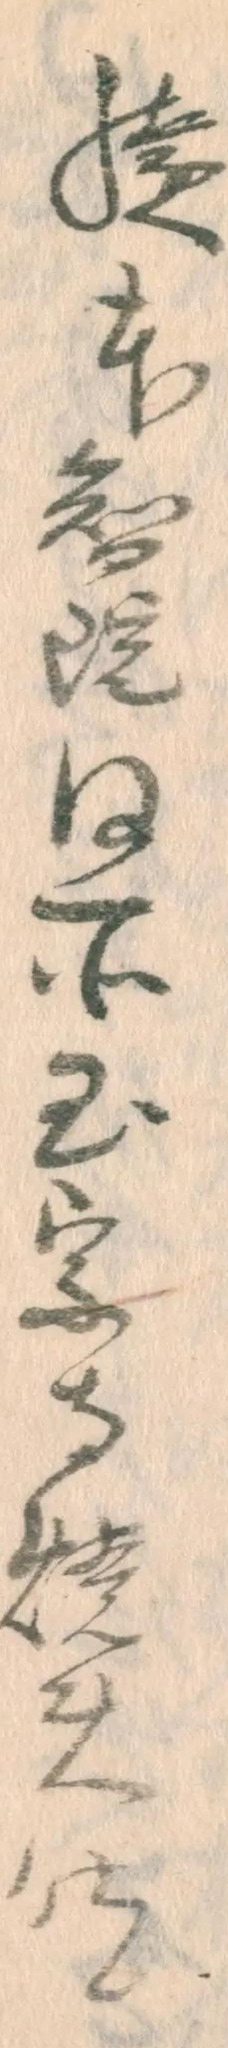続本智院同所玉宗寺焼失仕候
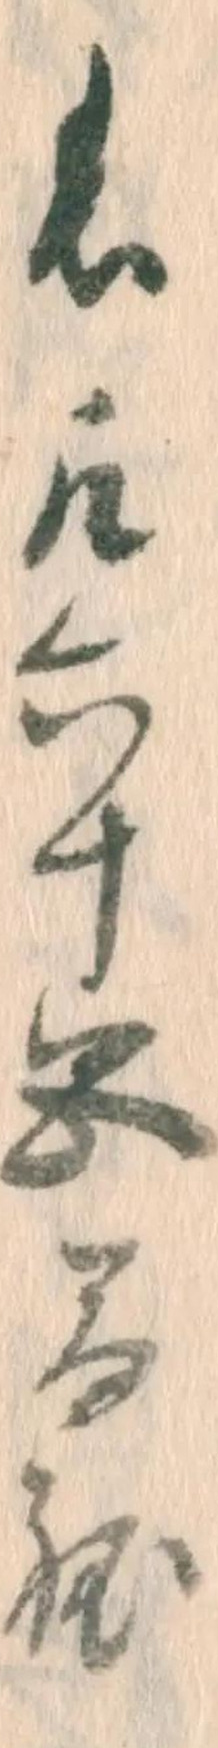長凡六十五間程
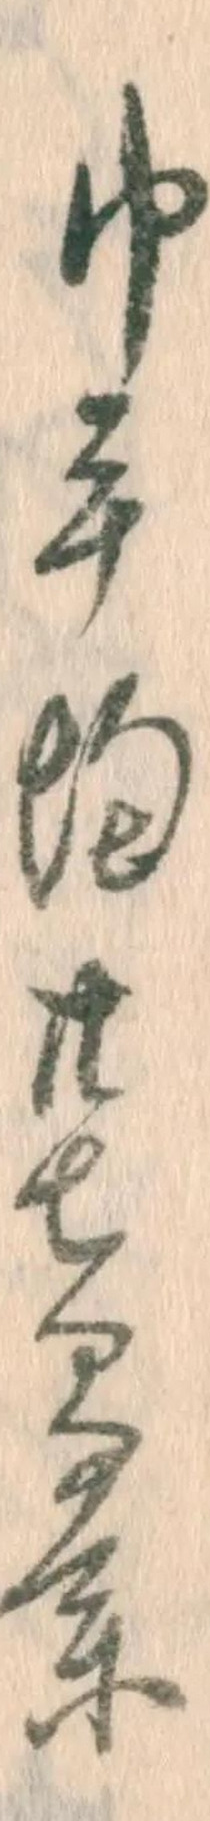幅平均廿七間余
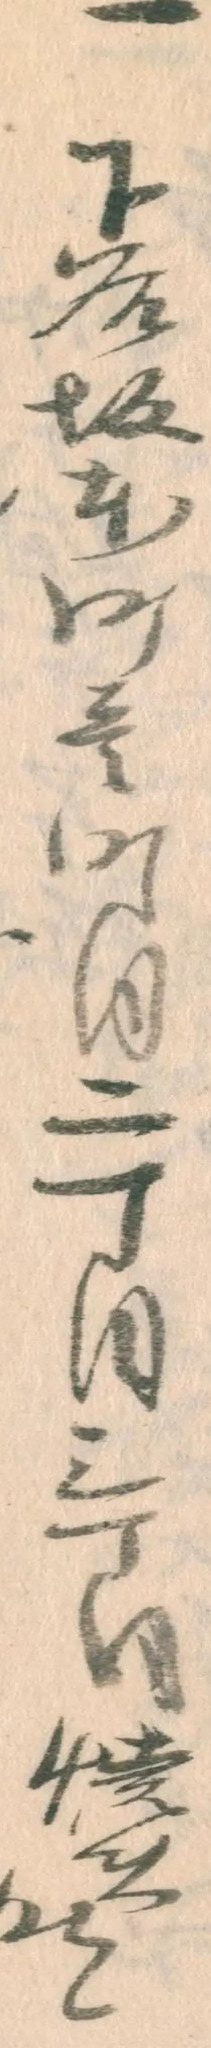一下谷坂本町壱町目二丁目三丁目焼失仕候
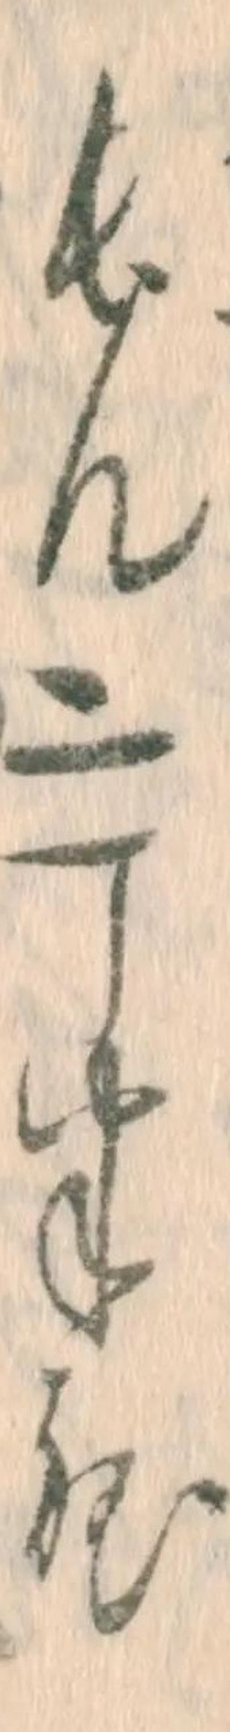長凡二丁半程
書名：地震災書留 2巻. [1] 内表紙に「地震災書留　安政二卯年　但本所深川御用屋敷地代免除調」とあり
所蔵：国立国会図書館 National Diet Library, JAPAN
